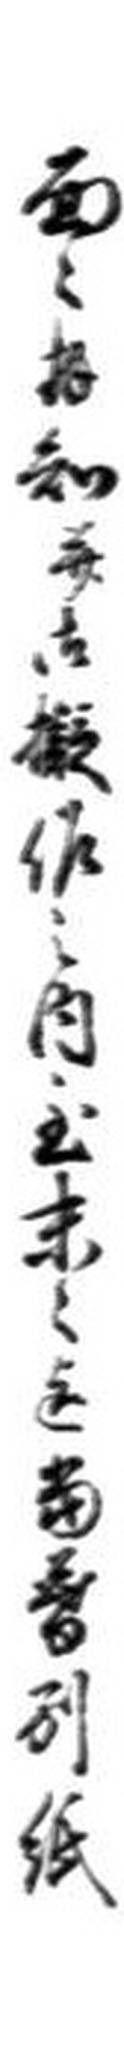面々拝知幷御擬作之内至末々迄当暮別紙
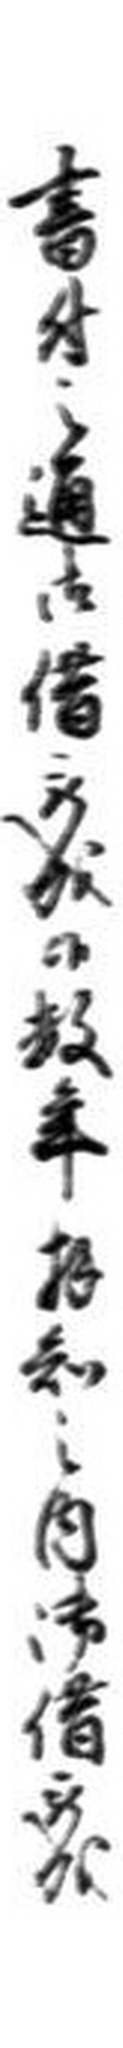書付之通御借被成候数年拝知之内御借被成

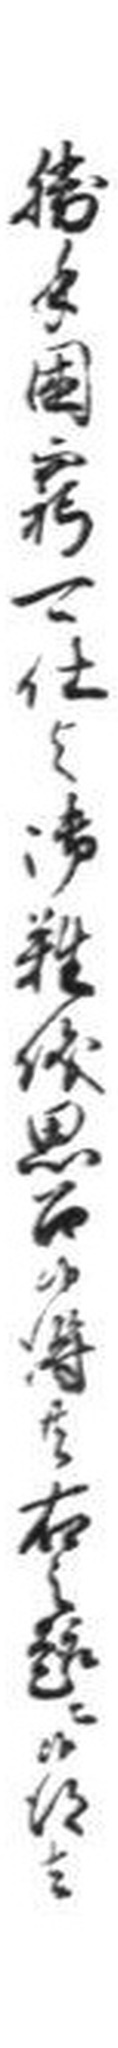勝手困窮可仕と御難儀思召候得共右之趣ニ候得者
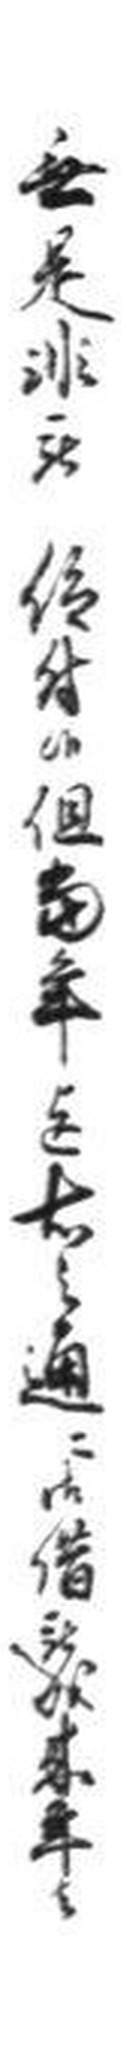無是非被仰付候但当年迄右之通ニ御借被成来年者
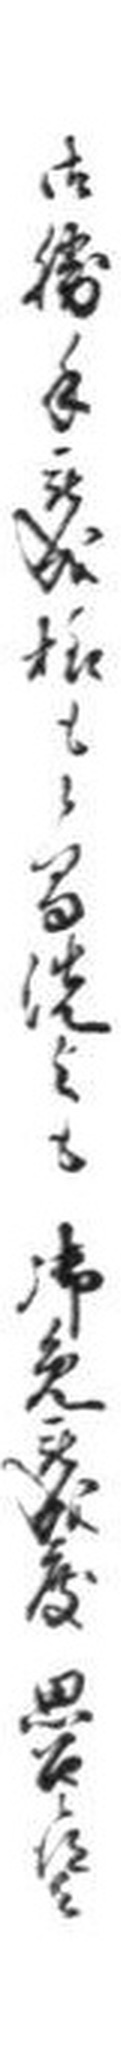御勝手被成様も候間洗とも御免被成度思召候得共
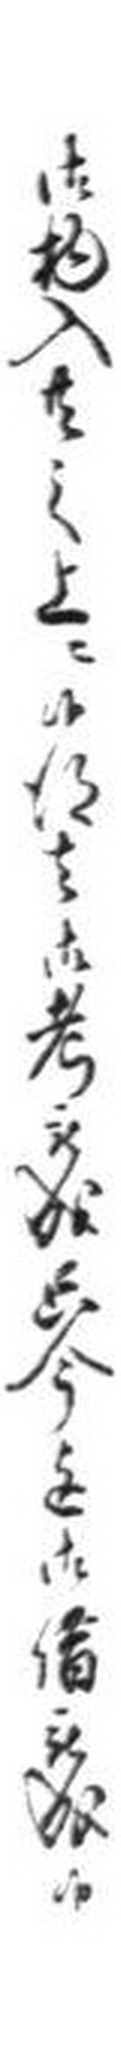御物入共之上ニ候得者御考被成只今迄御借被成候
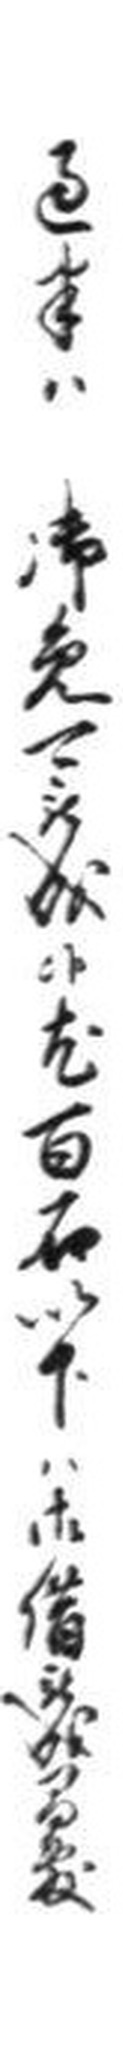過半ハ御免可被成候尤百石以下ハ御借被成間敷
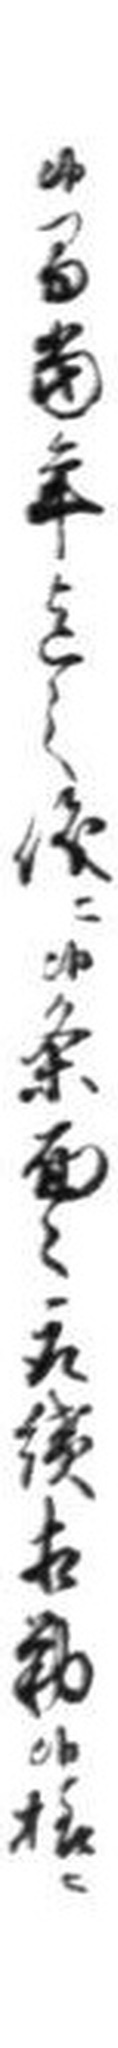候間当年迄之儀ニ候条面々取続相勤候様ニ
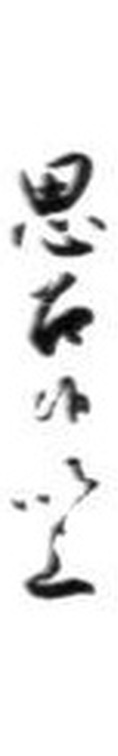思召候以上
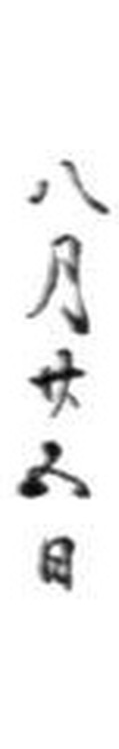八月廿五日
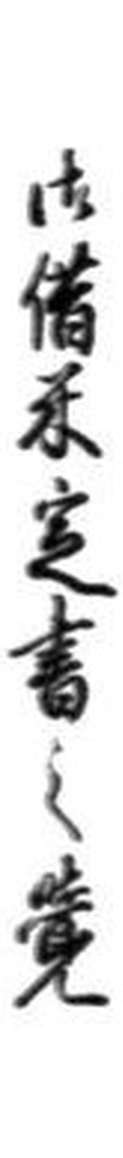御借米定書之覚
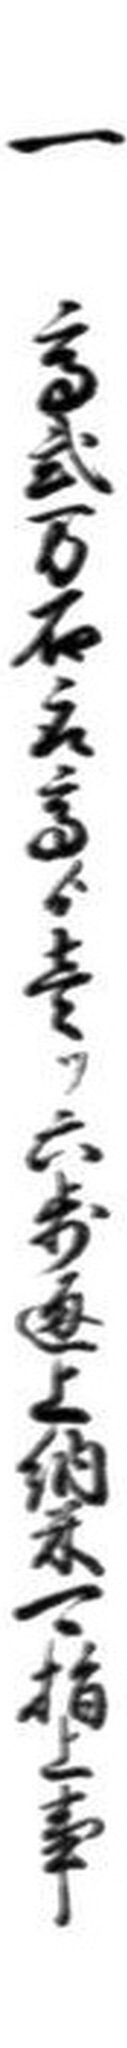一高弐万石取高ゟ壱ツ六歩通上納米可指上事
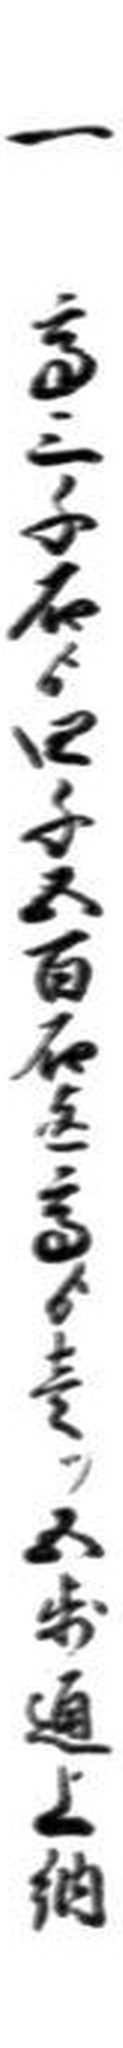一高三千石ゟ四千五百石迄高ゟ壱ツ五歩通上納
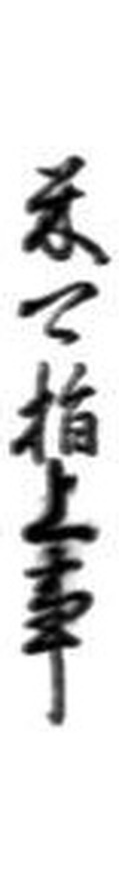米可指上事
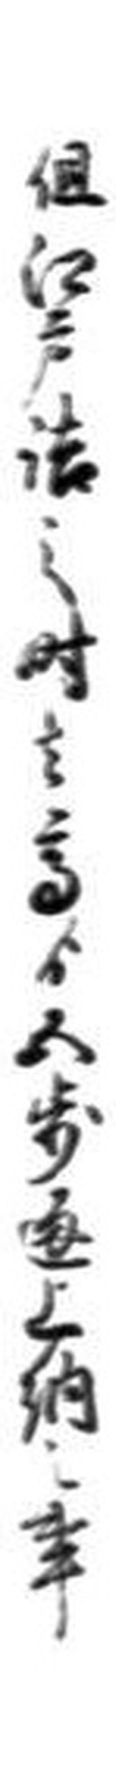但江戸詰之時者高ゟ五歩通上納之事
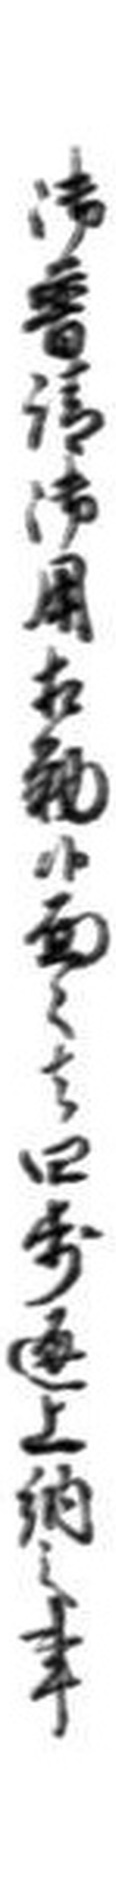御普請御用相勤候面々者四歩通上納之事
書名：家譜 三十一 吉邦公 享保元年
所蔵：福井県文書館 Fukui Prefectural Archives
